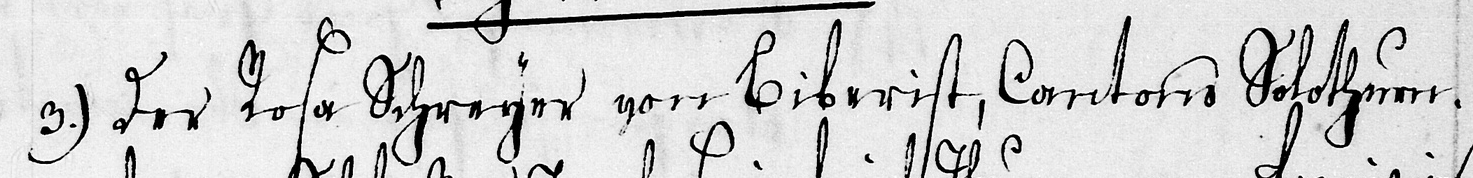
3.) Der Rosa Schreyer von Biberist, Cantons Solothurn.
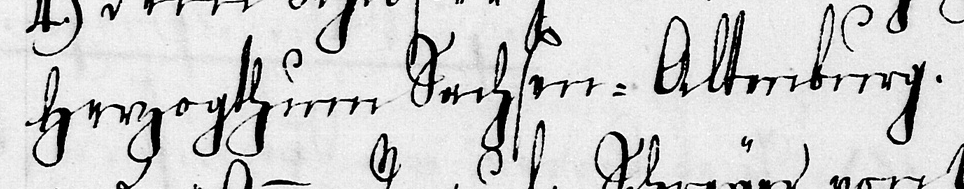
Herzogthum Sachsen-Altenburg.
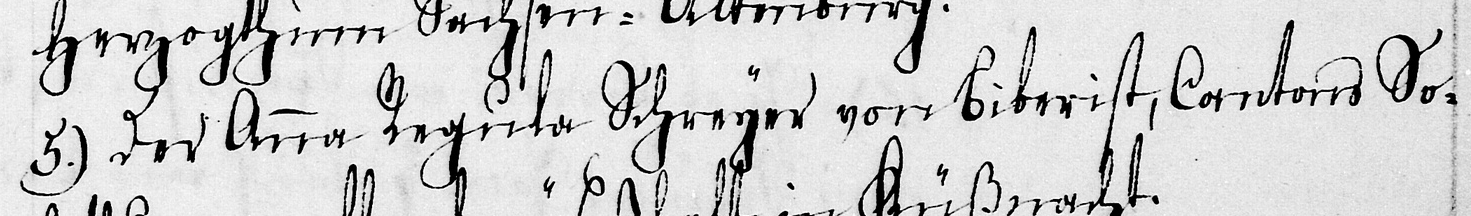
5.) Der Anna Regula Schreyer von Biberist, Cantons So¬
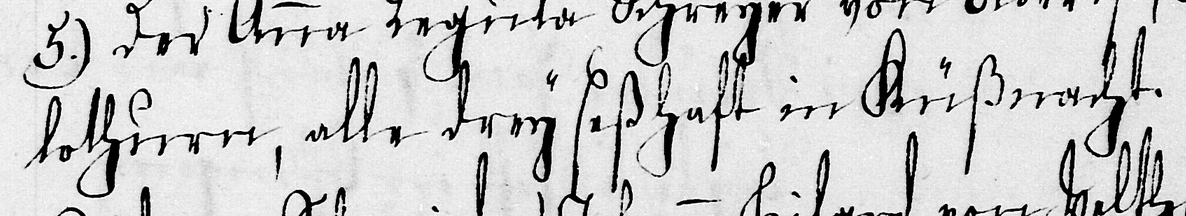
lothurn, alle drey seßhaft in Küßnacht.
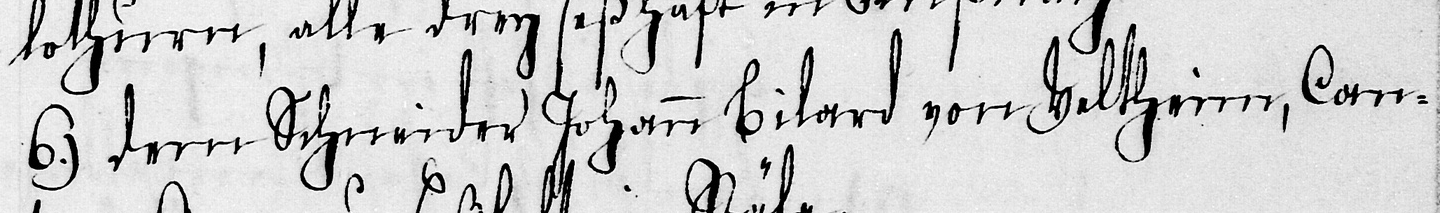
6.) dem Schneider Johann Bilard von Veltheim, Can¬
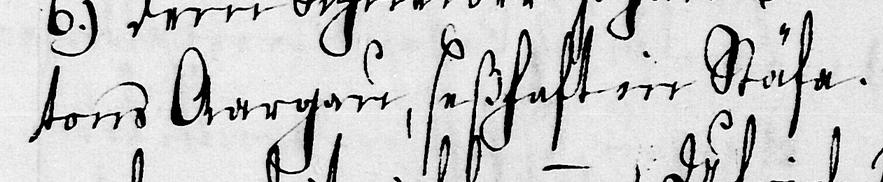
tons Aargau, seßhaft in Stäfa.
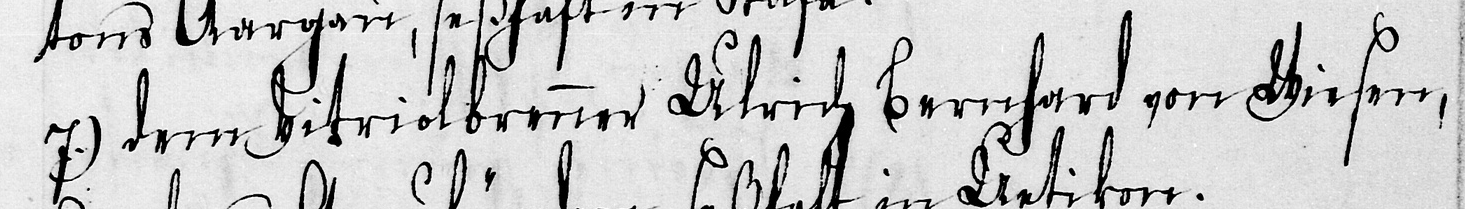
7.) dem Vitriolbrenner Ulrich Bernhard von Wiesen,
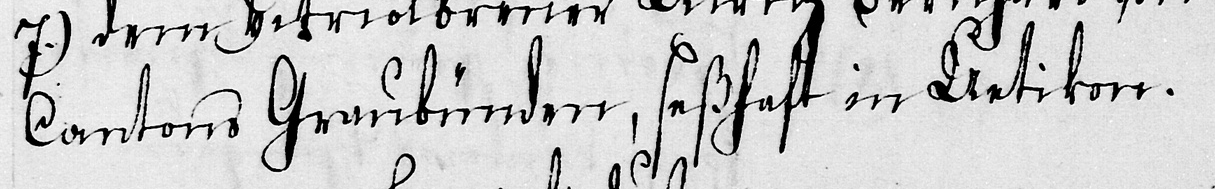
Cantons Graubünden, seßhaft in Uetikon.
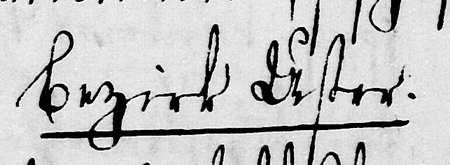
Bezirk Uster.
